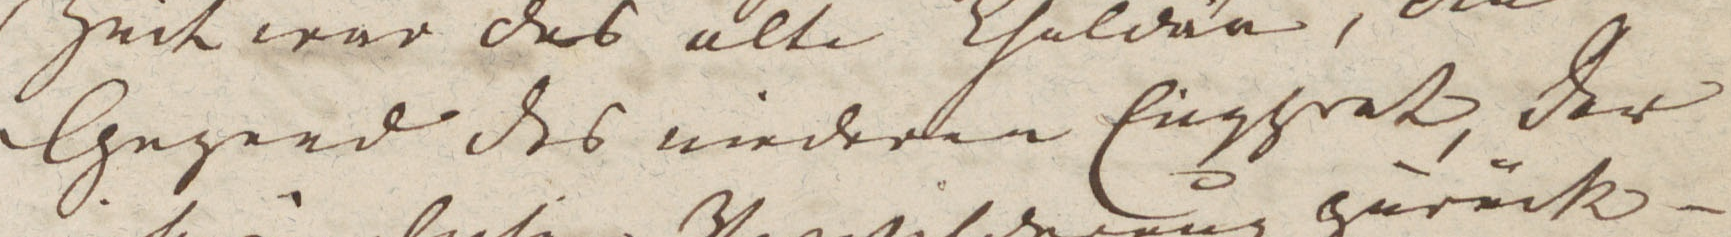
Gegend des niederen Euphrat, der
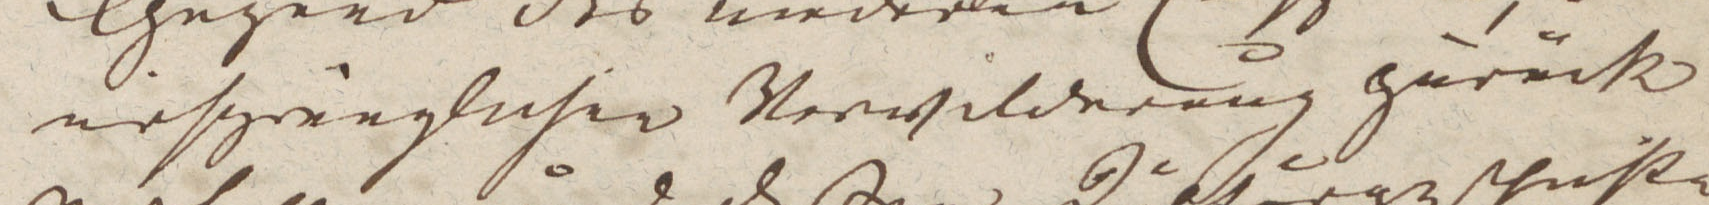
ursprünglichen Verwilderung zurück-
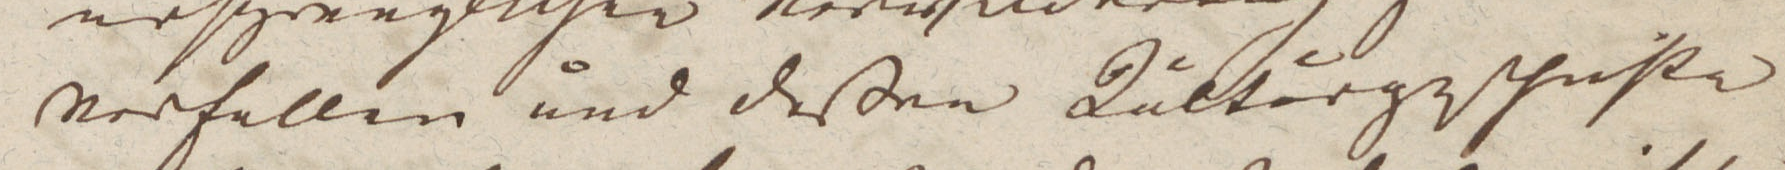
verfallen und dessen Kulturgeschichte
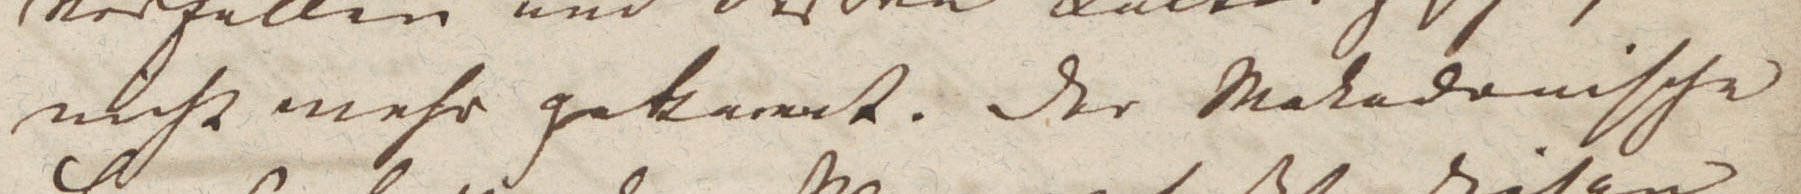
nicht mehr gekannt. Der Makedonische
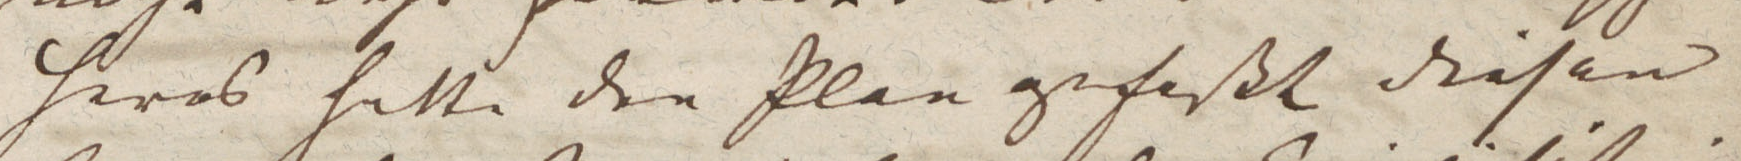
Heros hatte den Plan gefasst diesen
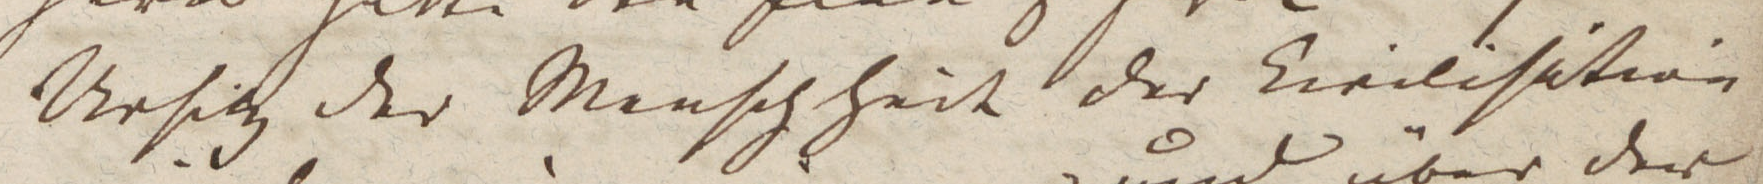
Ursitz der Menschheit der Civilisation
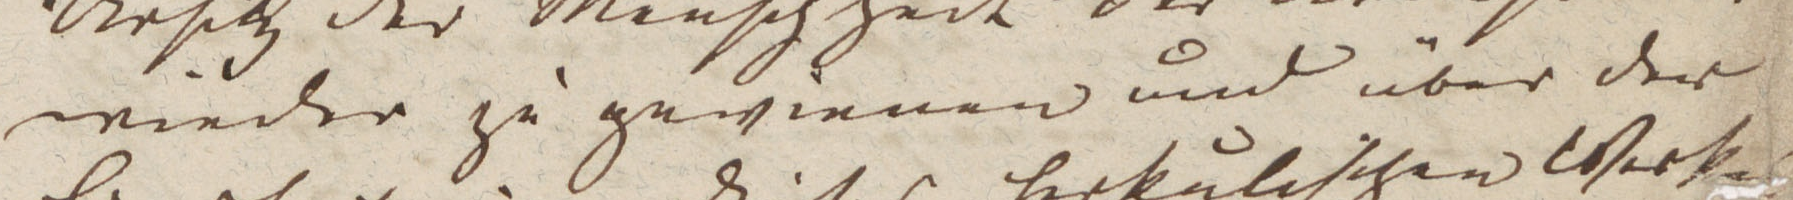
wieder zu gewinnen und über der
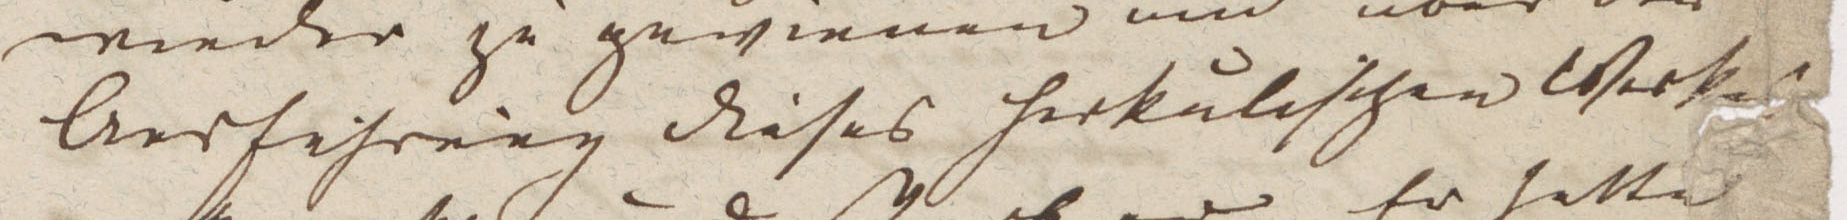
Ausführung dieses Herkulischen Werkes
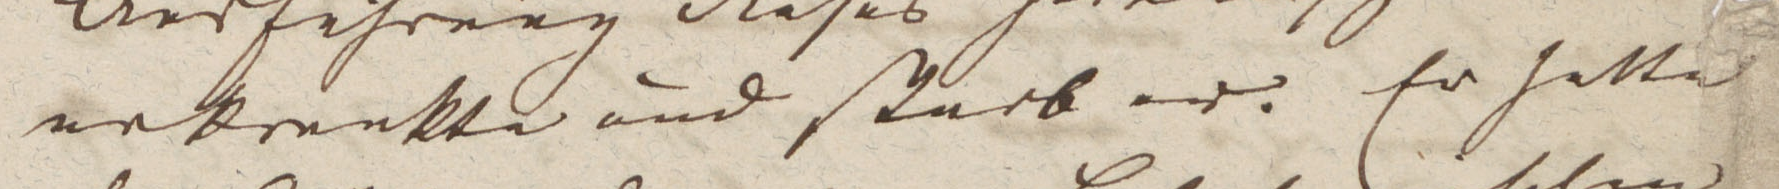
erkrankte und starb er. Er hatte
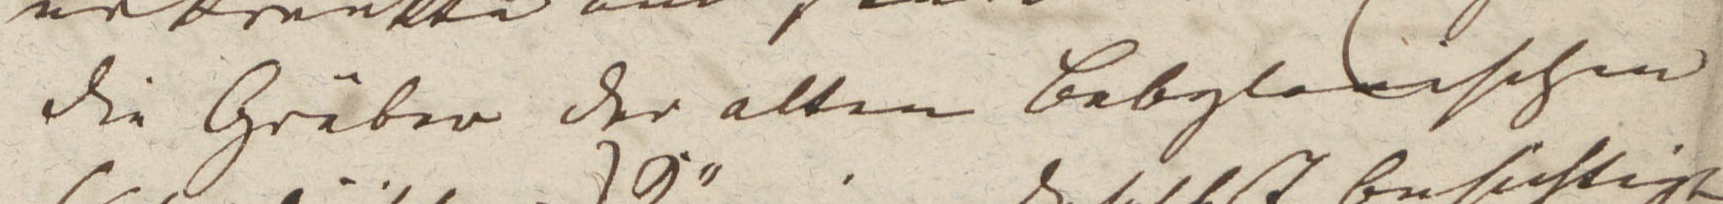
die Gräber der alten Babylonischen
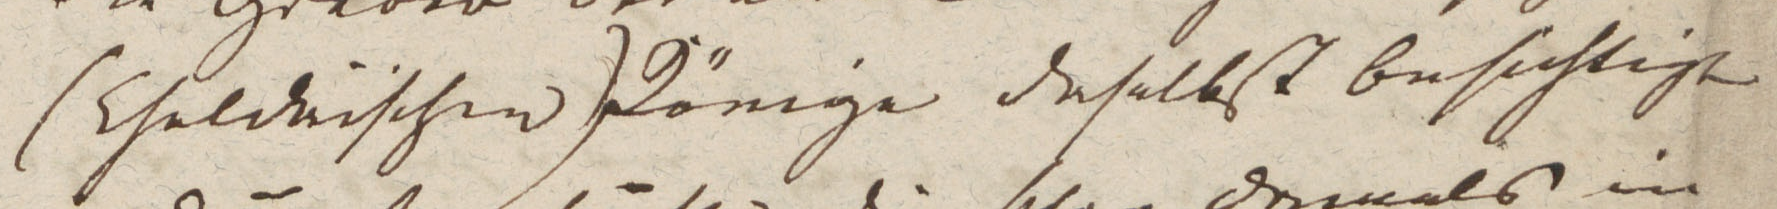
(Chaldäischen) Könige daselbst besichtigt
